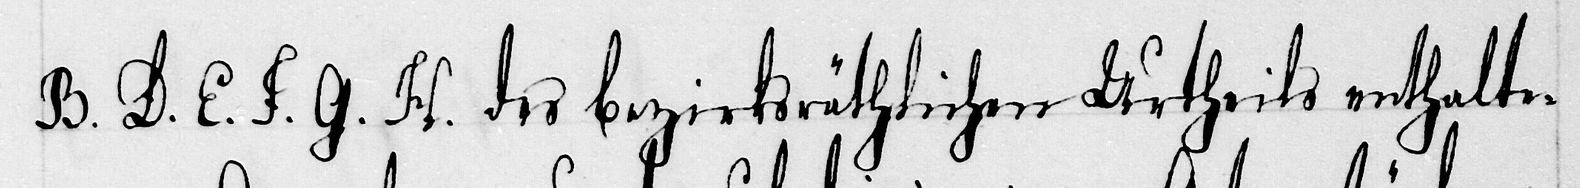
B. D. E. F. G. H. des bezirksräthlichen Urtheils enthalte¬
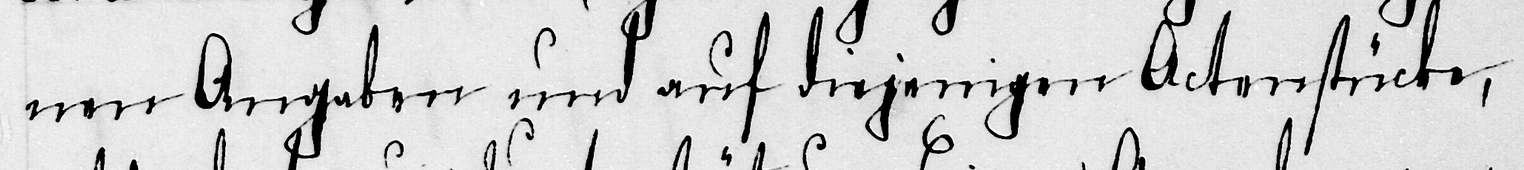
nen Angaben und auf diejenigen Actenstücke,
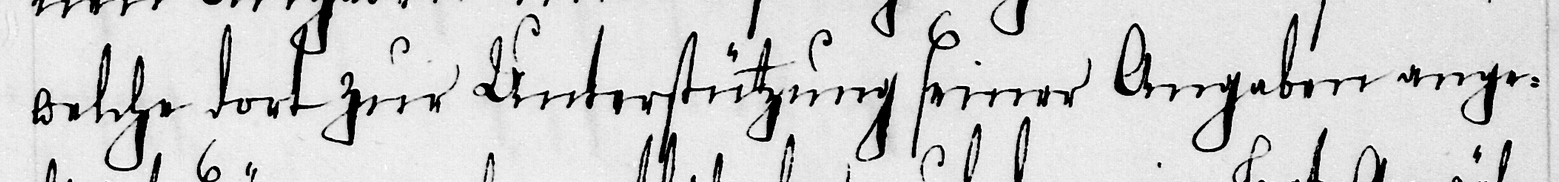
welche dort zur Unterstützung seiner Angaben ange¬
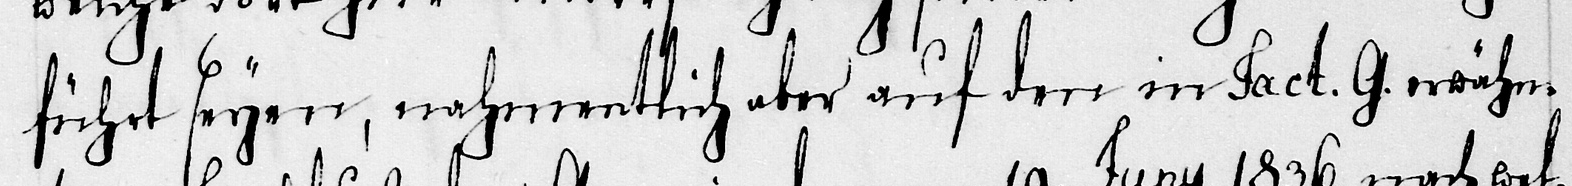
führt seyen, nahmentlich aber auf den in Fact. G. erwähn¬
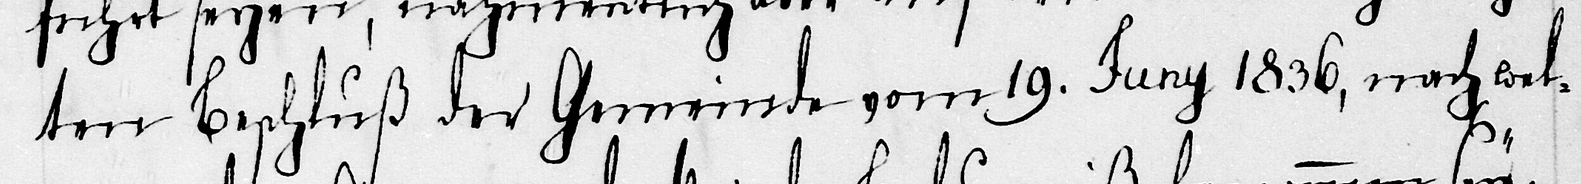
ten Beschluß der Gemeinde vom 19. Juny 1836, nach wel¬
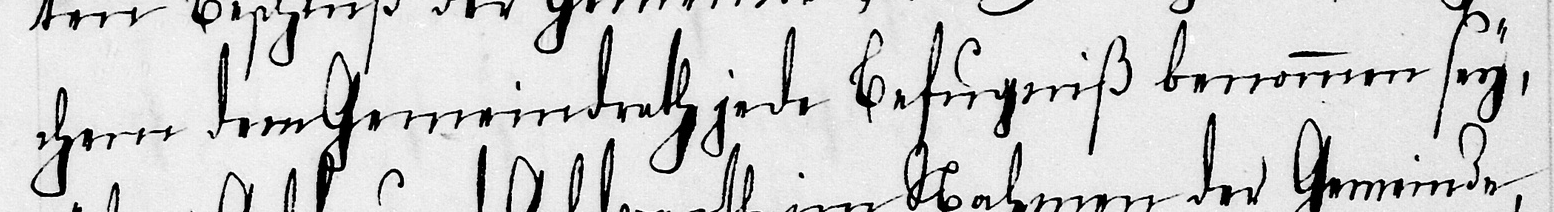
chem dem Gemeindrath jede Befugniß benommen sey,
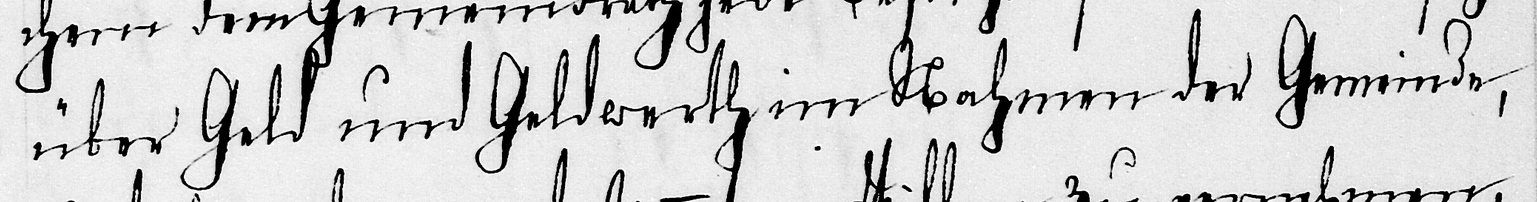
über Geld und Geldwerth im Nahmen der Gemeinde,
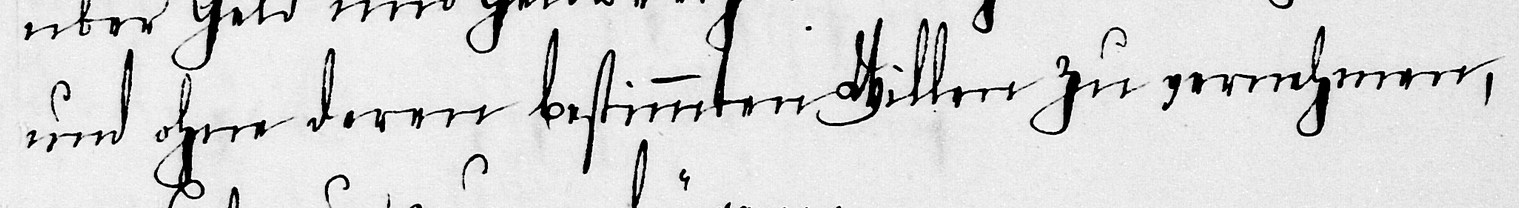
und ohne deren bestimmten Willen zu vernehmen,
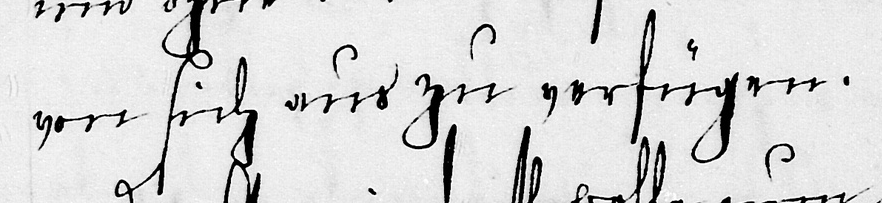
von sich aus zu verfügen.
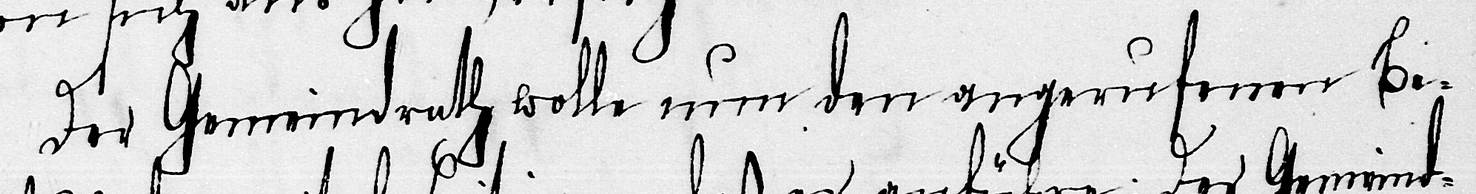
Der Gemeindrath wolle nun den angerufenen Be¬
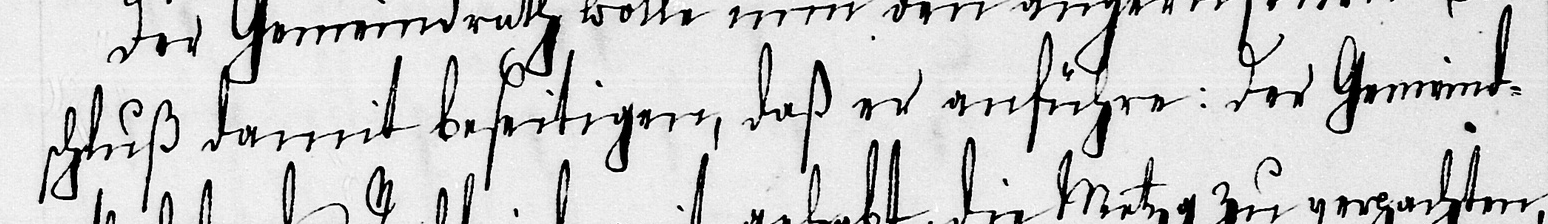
schluß damit beseitigen, daß er anführe: Der Gemeindr¬
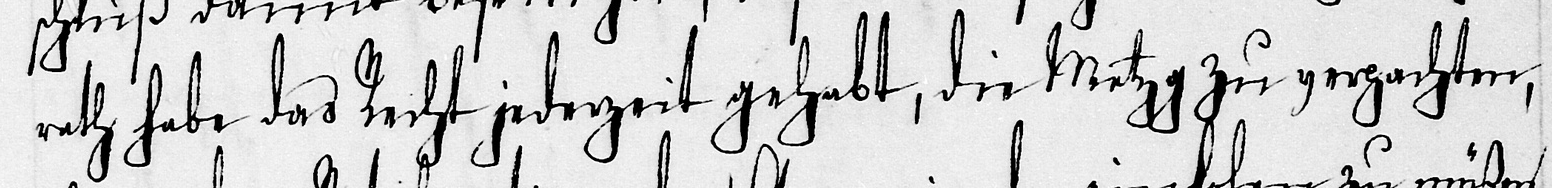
ath habe das Recht jederzeit gehabt, die Metzg zu verpachten,
